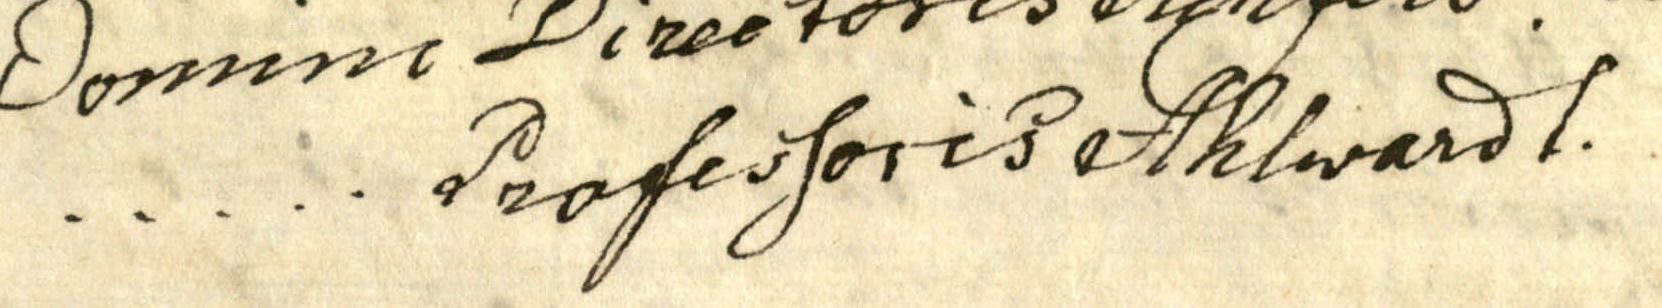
Professoris Ahlwardt.
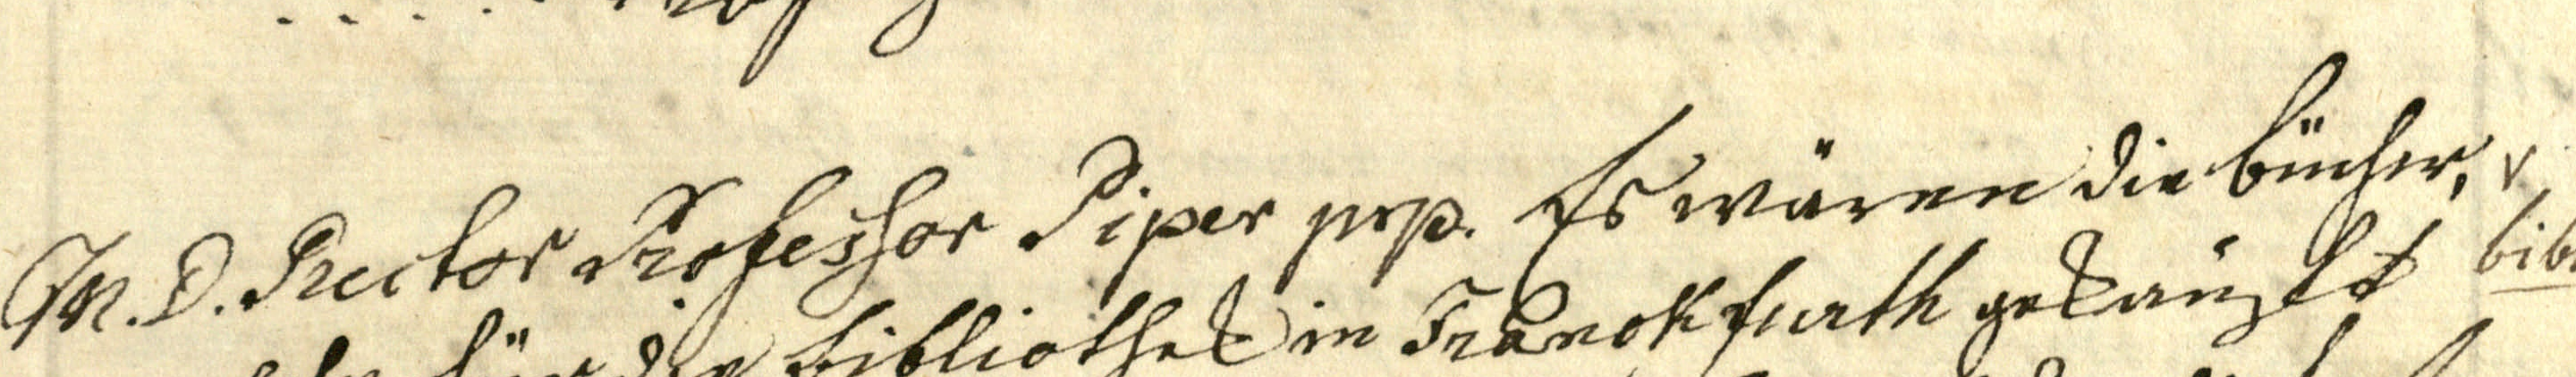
M. D. Rector Professor Piper prp. Es wären die Bücher,
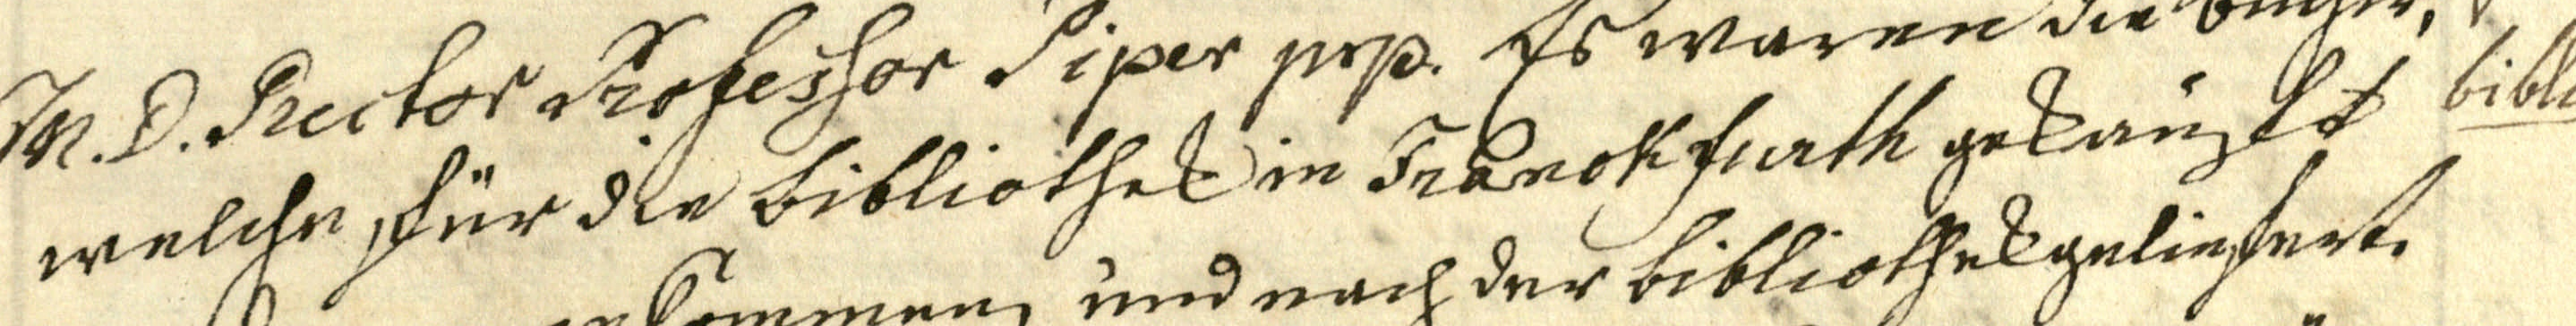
welche für die Bibliothek im Franckfurth gekauft
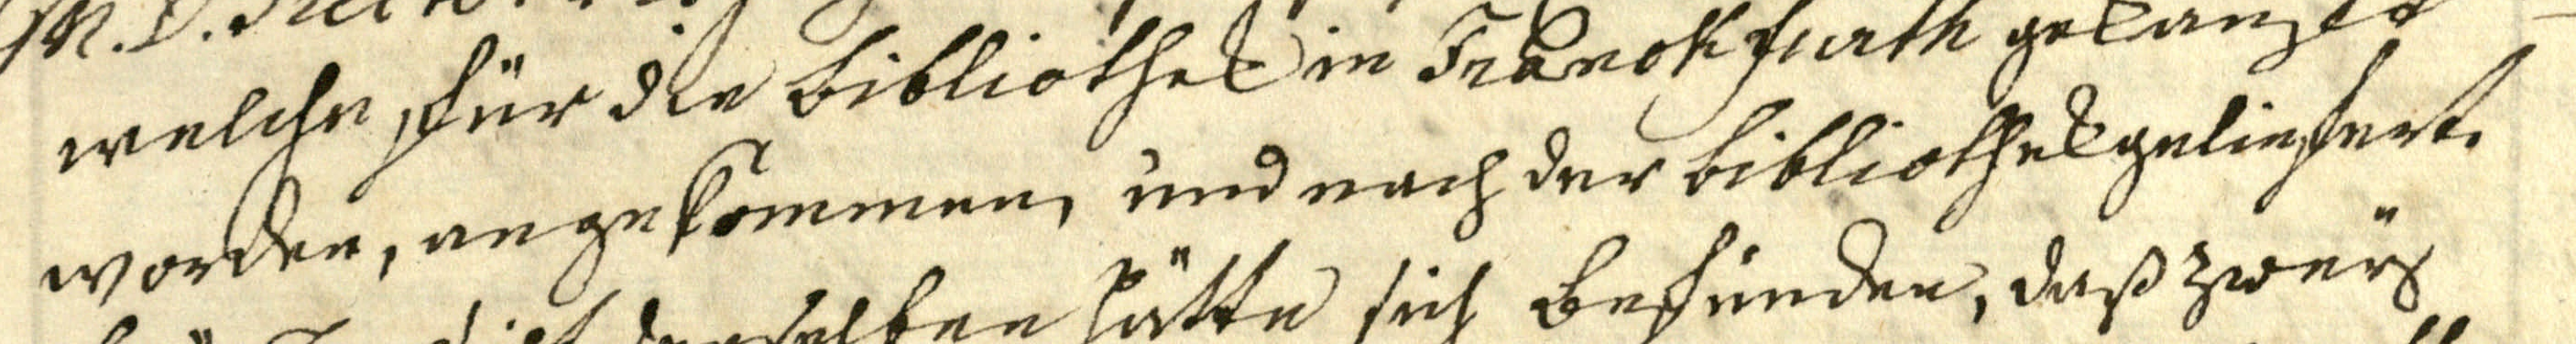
worden, angekommen, und nach der Bibliothek geliefert.
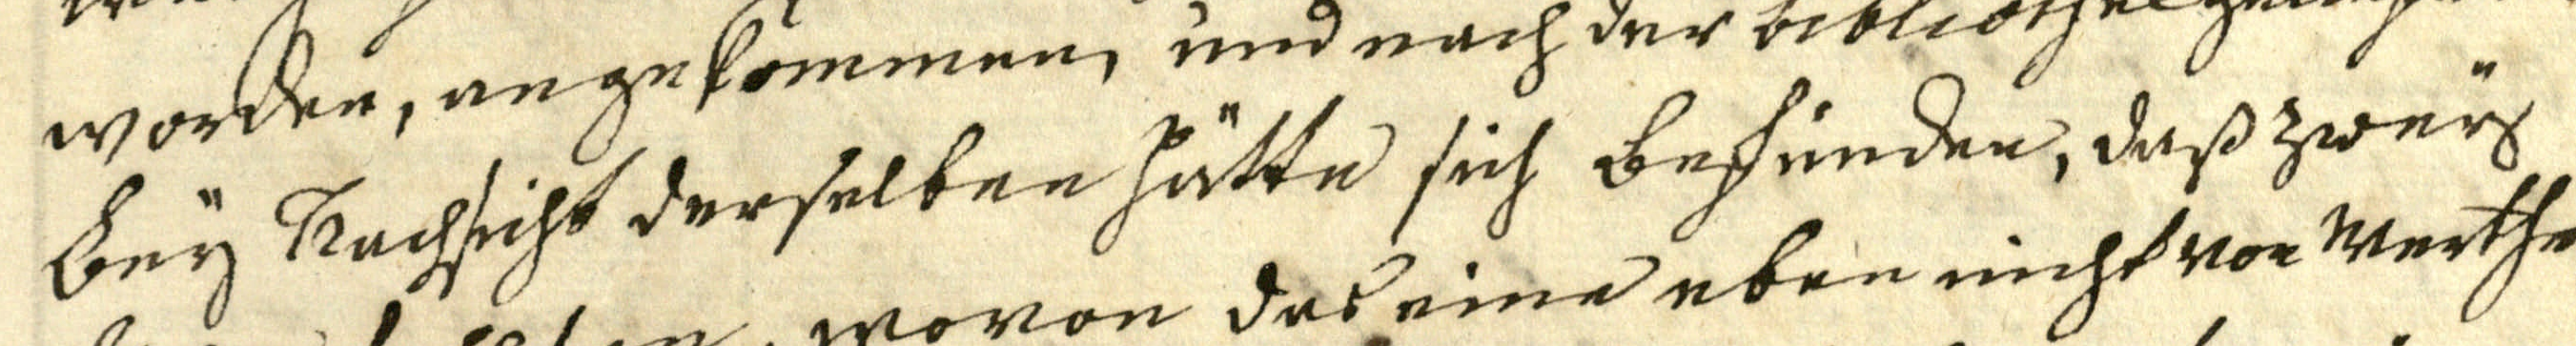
Beÿ Nachsicht derselben hätte sich befunden, daß zweÿ
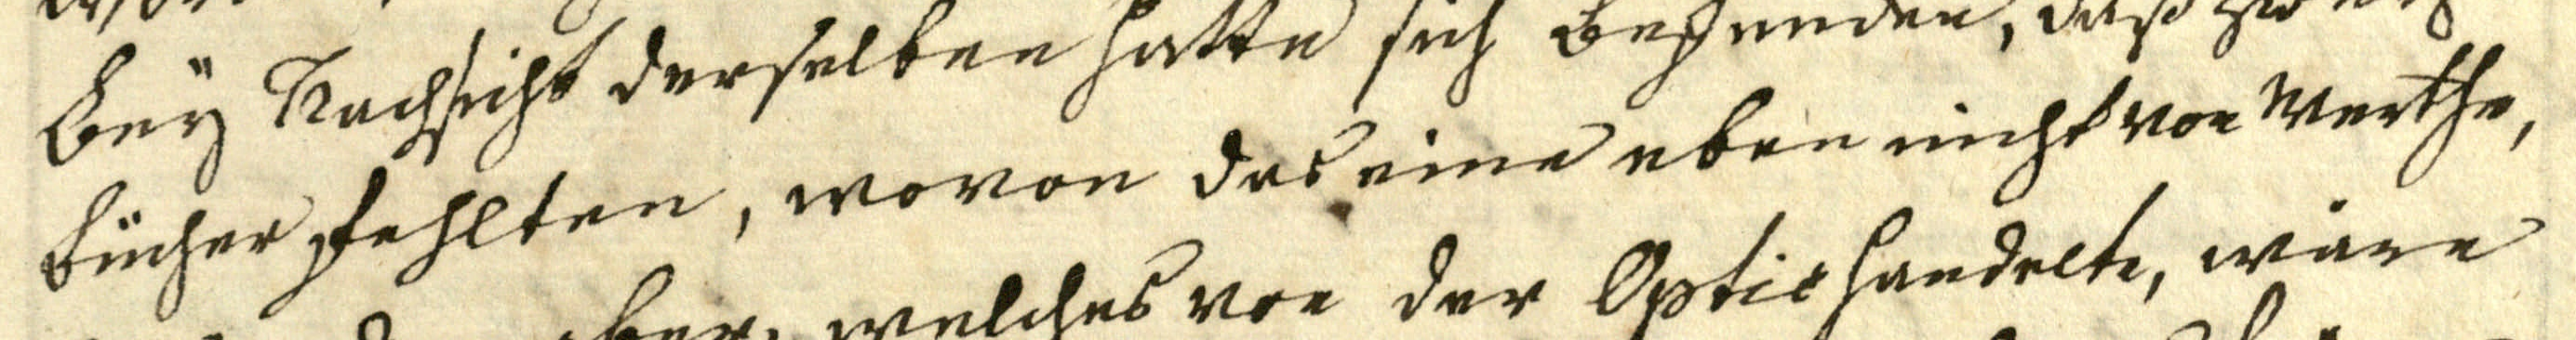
Bücher fehlten, wovon das eine eben nicht von Werthe,
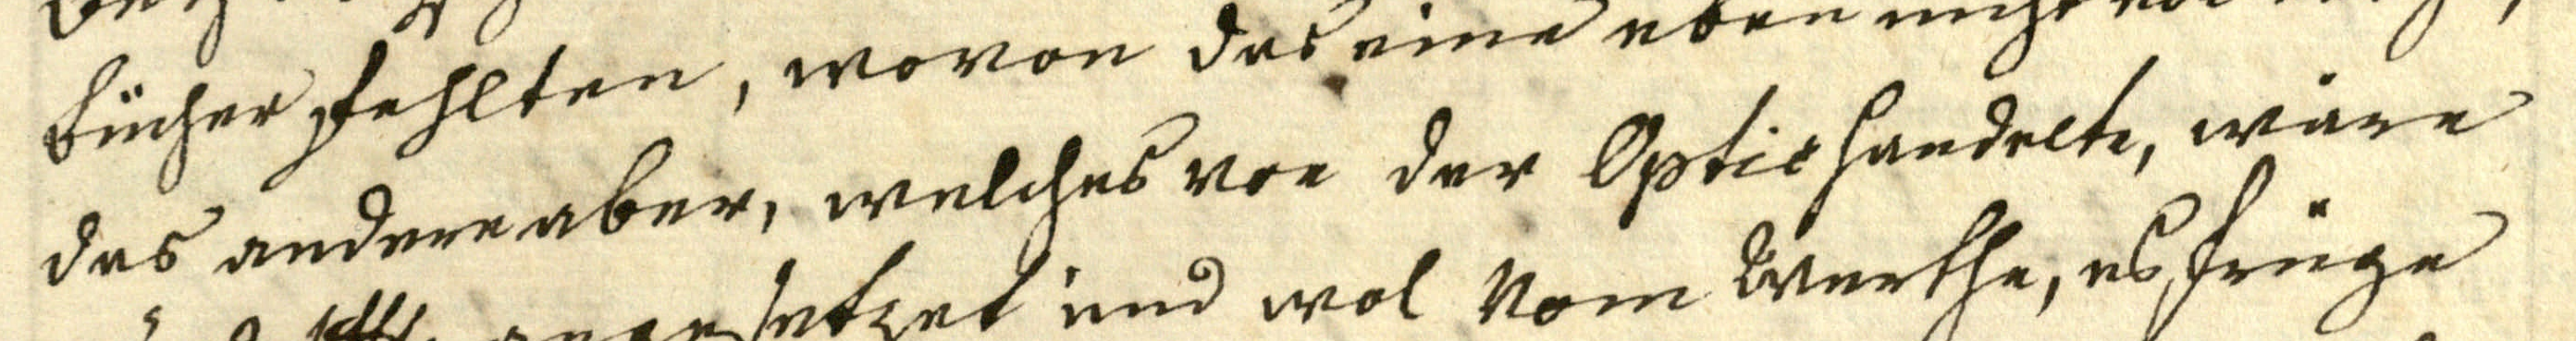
das andere aber, welches von der Optic handelte, wäre
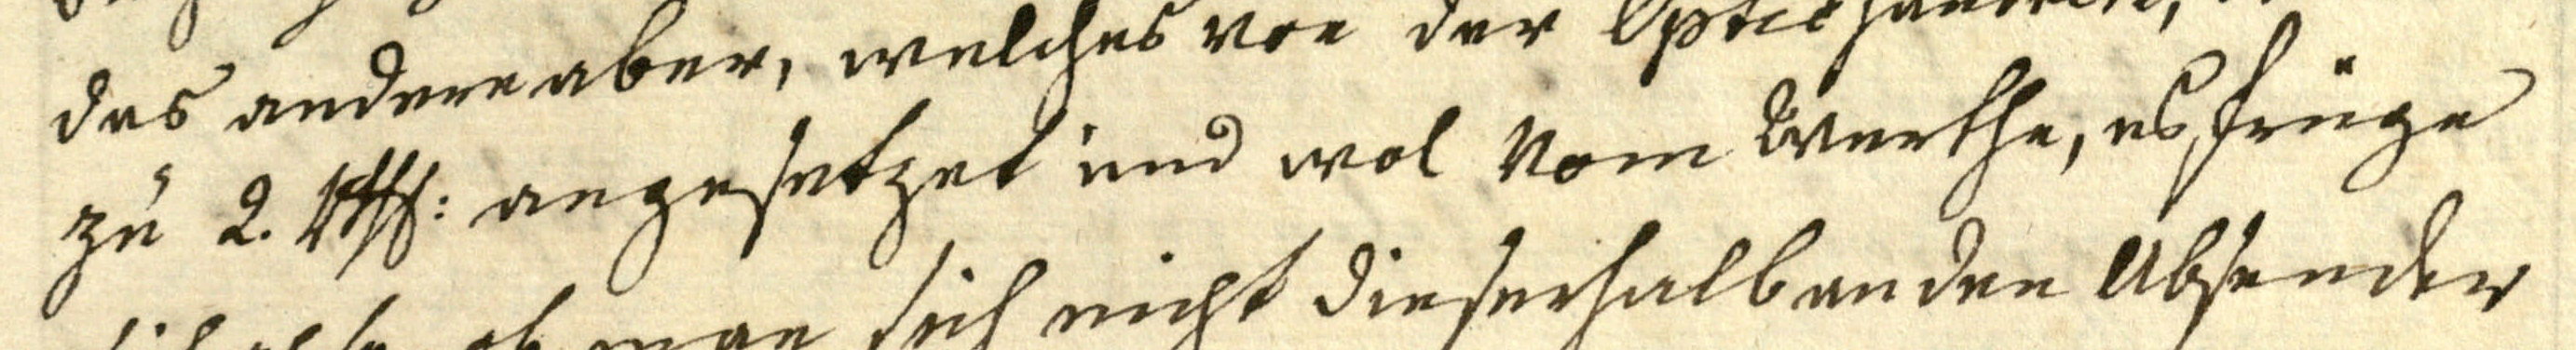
zu 2 rth. angesetzet und wol vom Werthe, es früge
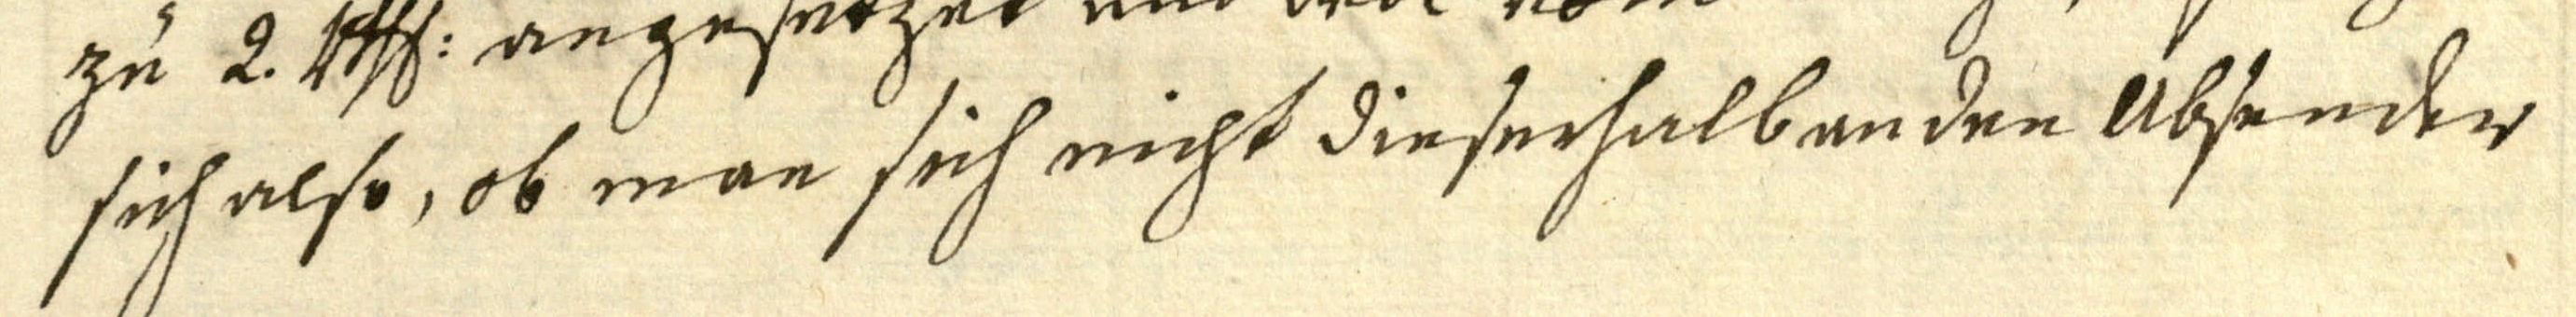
sich also, ob man sich nicht dieserhalb an den Absender
